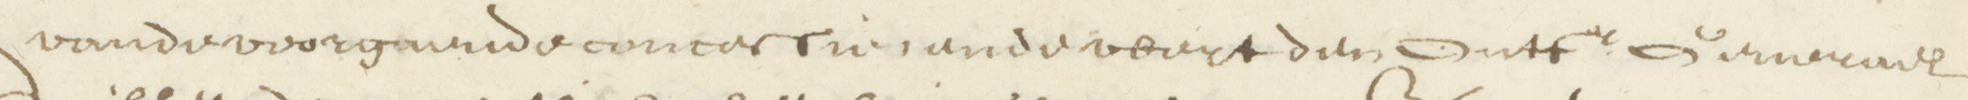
vande voorgaende concessie, ende wert den Ontfr. Generael
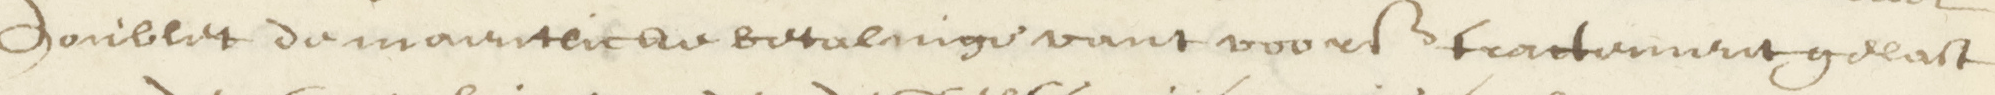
Doublet de maentlicke betalinge vant voors tractement gelast
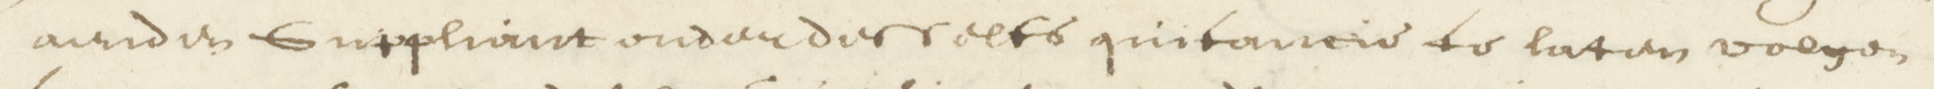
aenden Suppliant onder desselfs quitancie te laten volgen
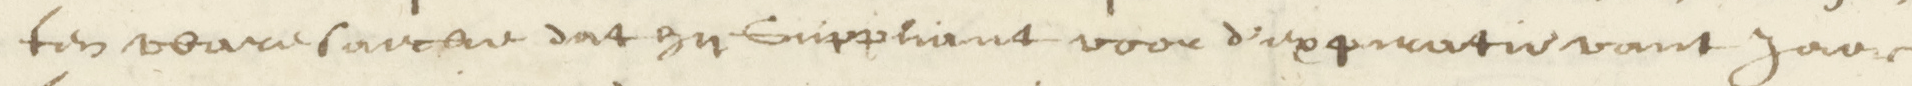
ten ware saecke dat hy Suppliant voor d'expiratie vant Jaer
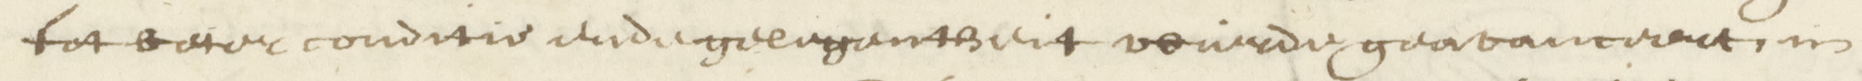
tot beter conditie ende gelegentheit wierde geavanceert, in
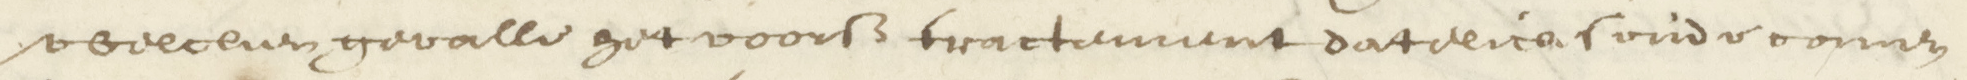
welcken gevalle het voors tractement datelick soude comen
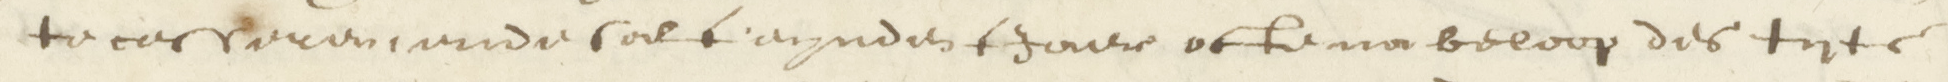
te cesseren, ende sal t'eynden tJaer ofte na beloop des tyts
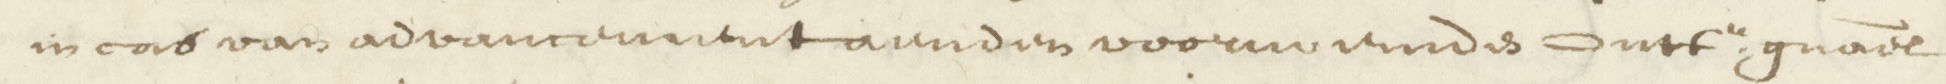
in cas van advancement aenden voornoemden Ontfr. gnael
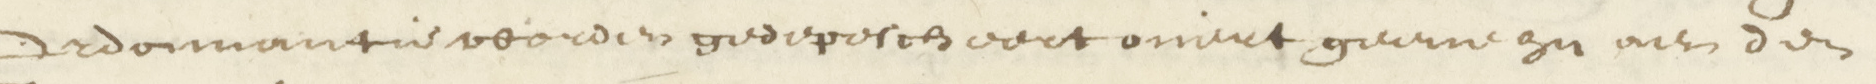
Ordonnantie worden gedepescheert ouert geene hy aen den
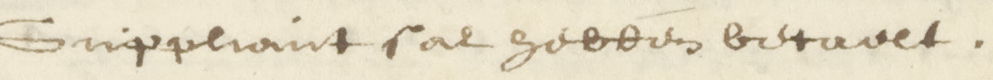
Suppliant sal hebben betaelt.
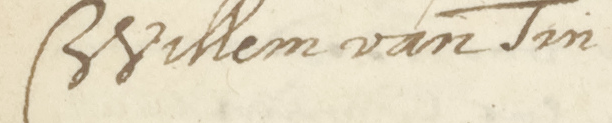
Willem van Tin
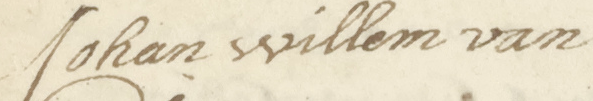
Johan Willem van
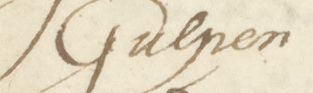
Gulpen
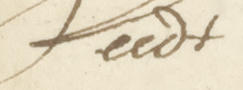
eedt
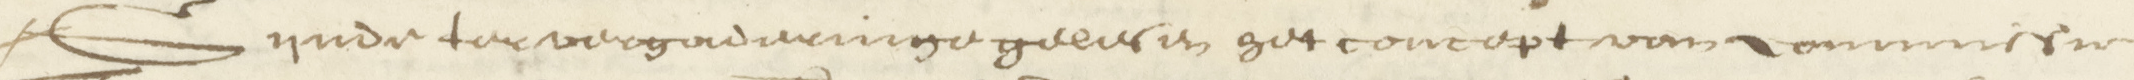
Synde ter vergaderinge gelesen het concept van commissie
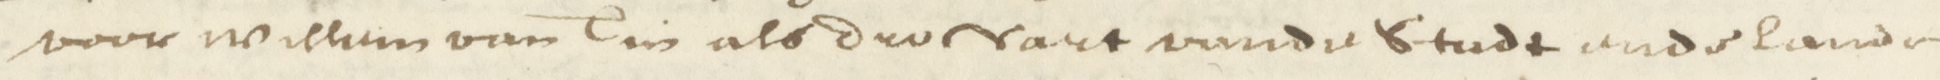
voor Willem van Tin als drossart vande Stadt ende lande
